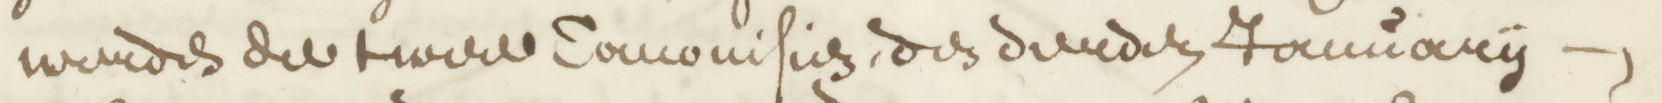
werden de twee Canonisien, den derden Januarij -,
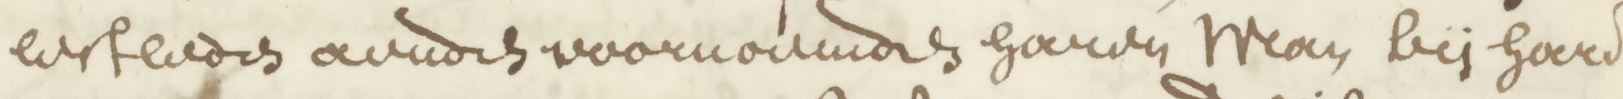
lestleden aenden voornoemden haren Man bij hare
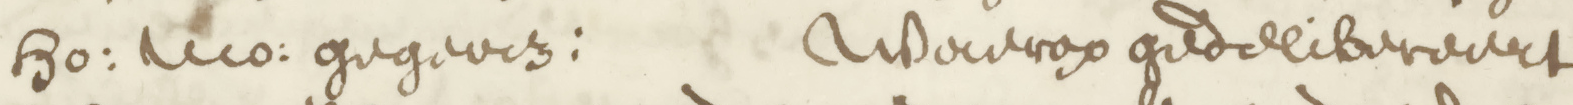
ho:mo: gegeven: Waerop gedelibereert
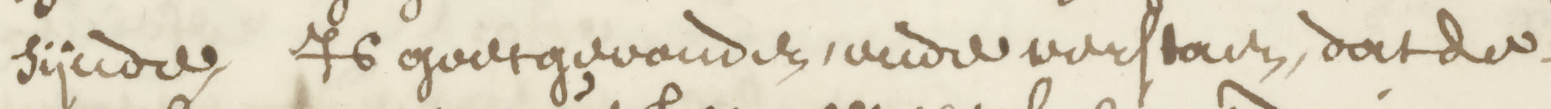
sijnde, Is goetgevonden, ende verstaen, dat de
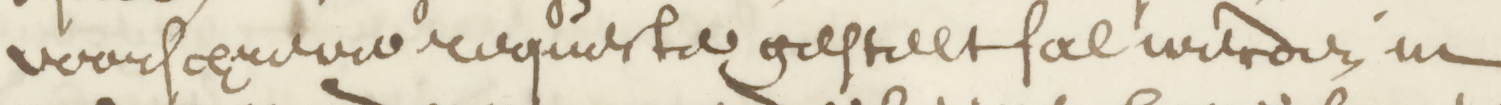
voorschreve requeste gestelt sal werden in
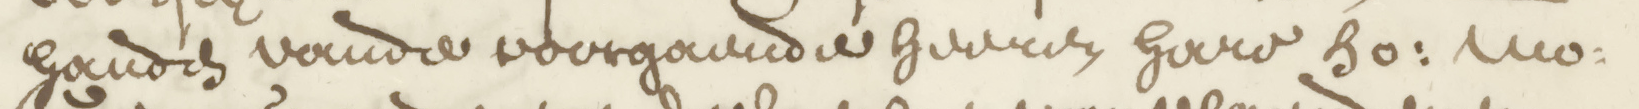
handen vande voorgaende heeren hare ho:mo:
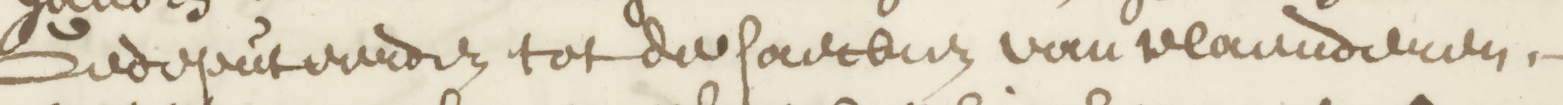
Gedeputeerden tot de saecken van Vlaenderen,
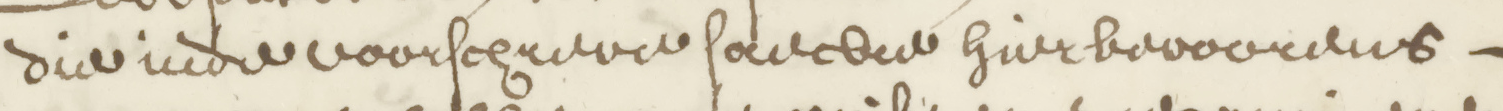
die inde voorschreve saecke hier bevoorens
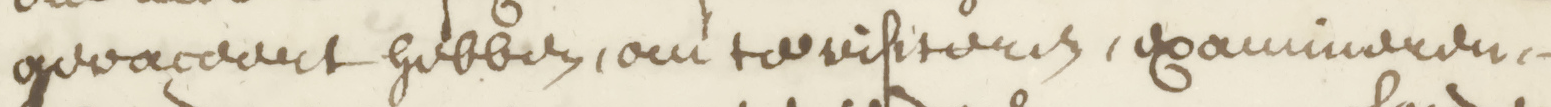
gevaceert hebben, om te visiteren, examineren,
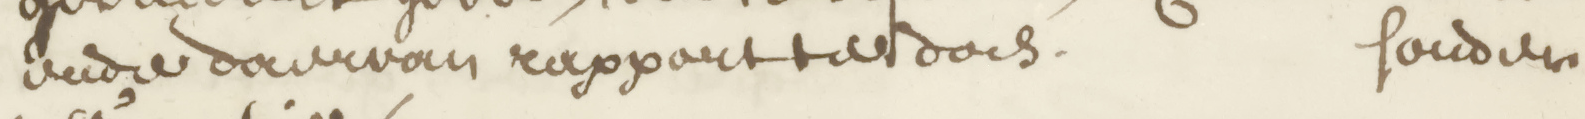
ende daervan rapport te doen. sonder
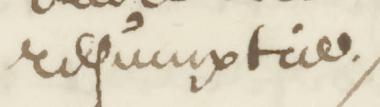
resumptie.
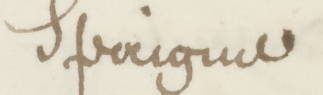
Spaigne
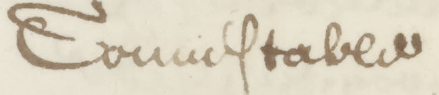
Connestable
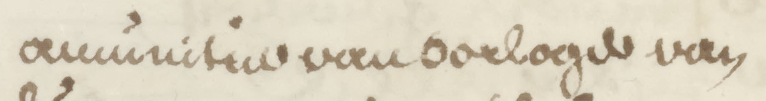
amunitie van oorloge van
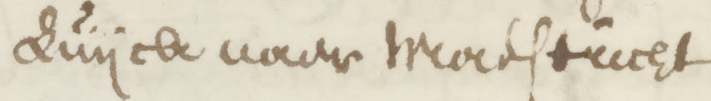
Luijck naer Maestricht
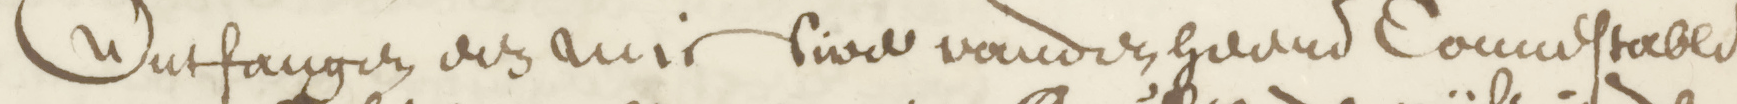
Ontfangen een missive vanden heere Connestable
